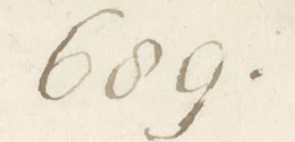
689.
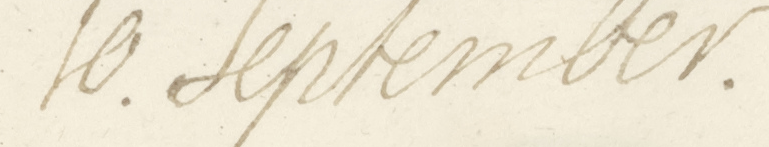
10. September.
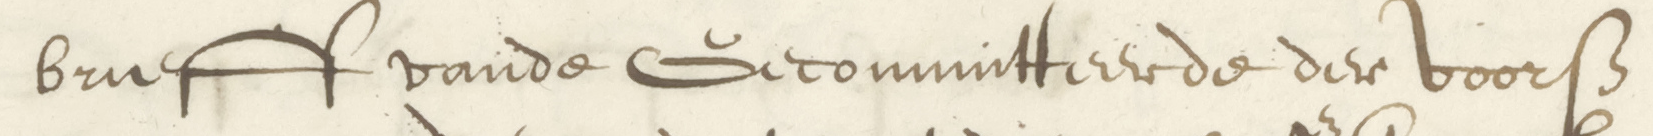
brieff vande Gecommitteerde der voors
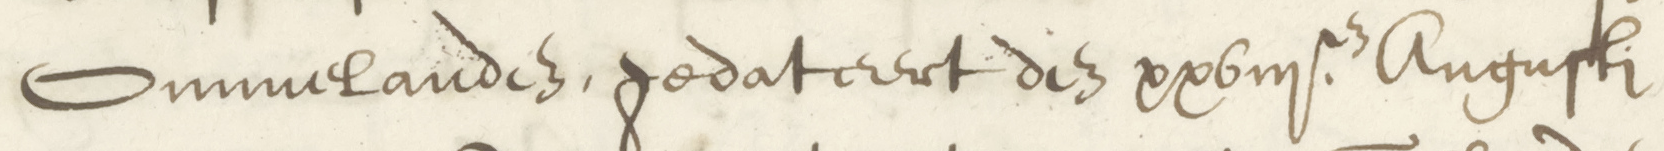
Ommelanden, gedateert den xxviijen Augusti
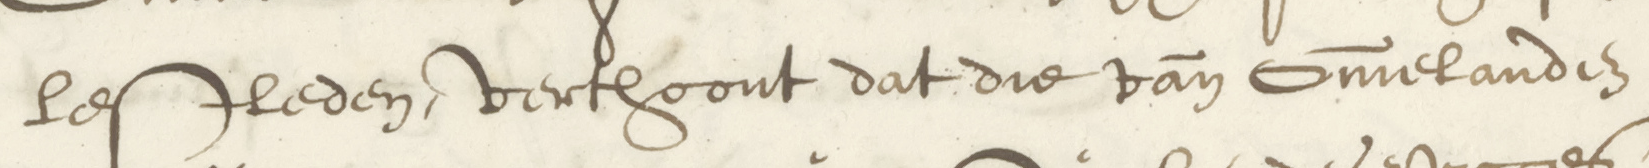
lestleden, verthoont dat die van Omelanden
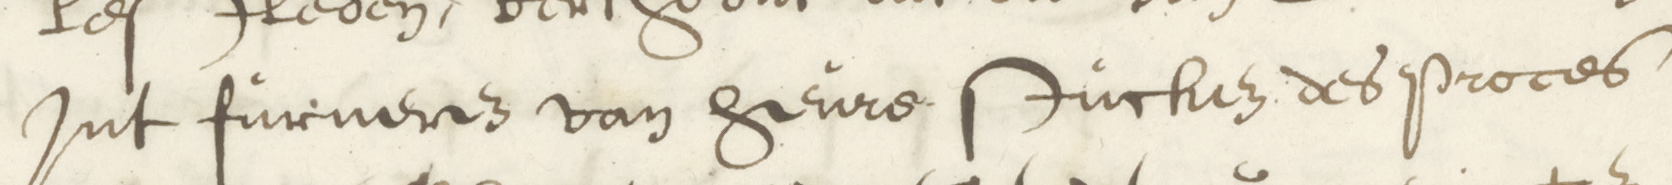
Int furneren van heure stucken des Proces
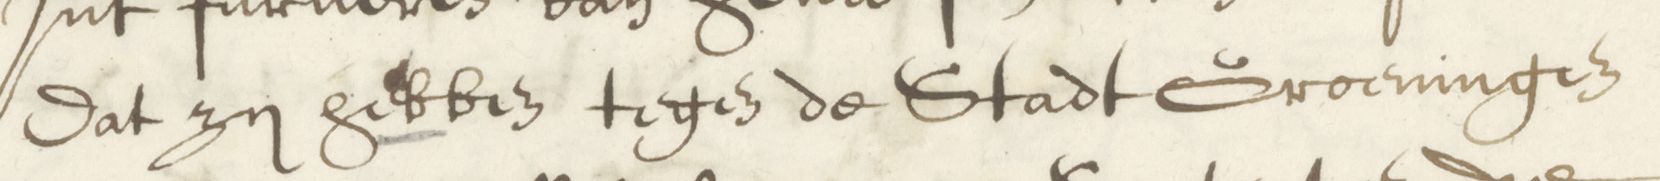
dat zij hebben tegen de Stadt Groeningen
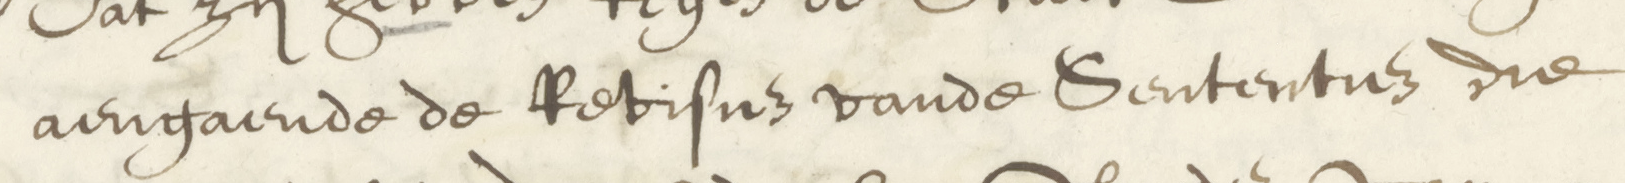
aengaende de Revisien vande Sententien die
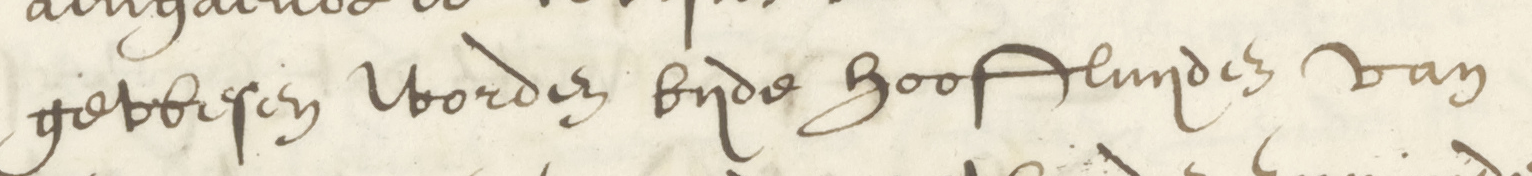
gewesen worden byde hooftluyden van
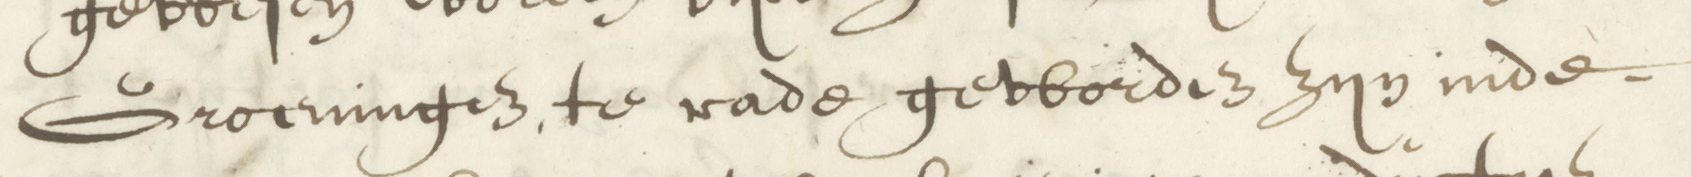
Groeningen, te rade geworden zijn inde
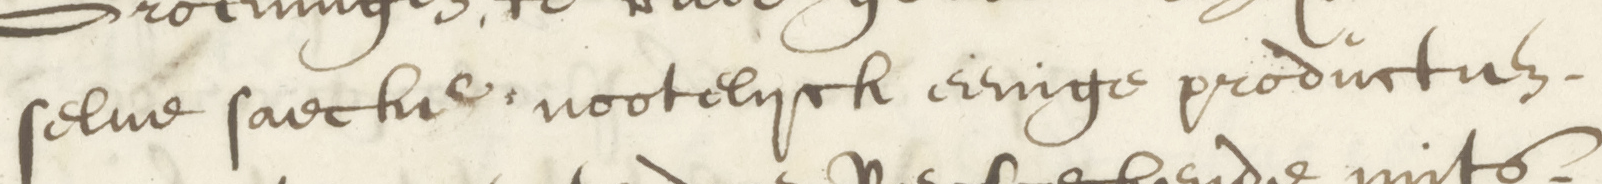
selue saecke nootelyck eenige productien
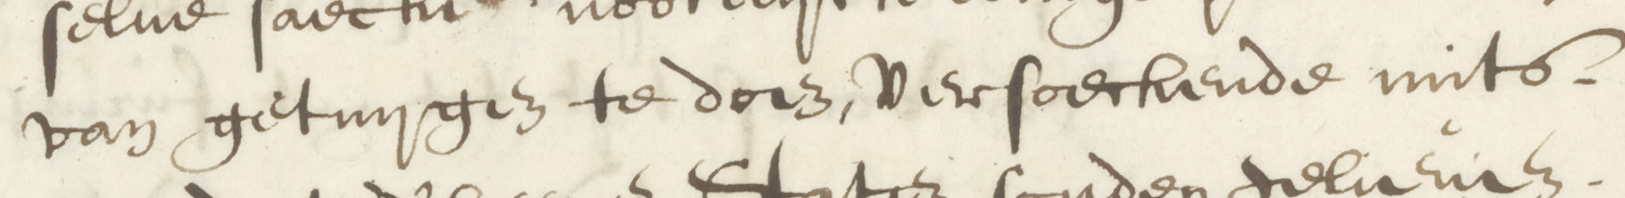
van getuijgen te doen, Versoeckende mits
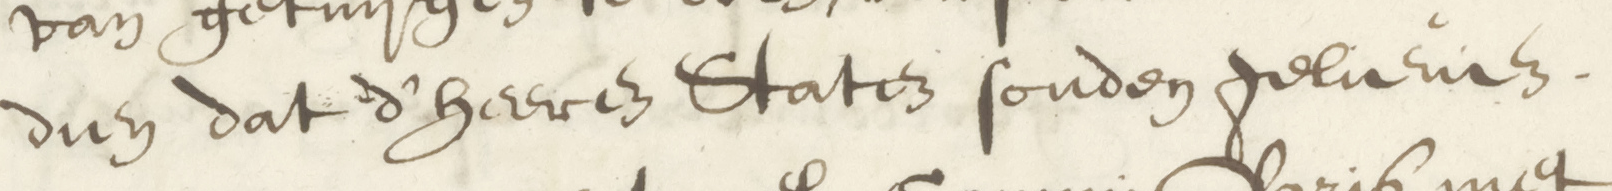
dien dat d'heeren Staten souden gelieuen
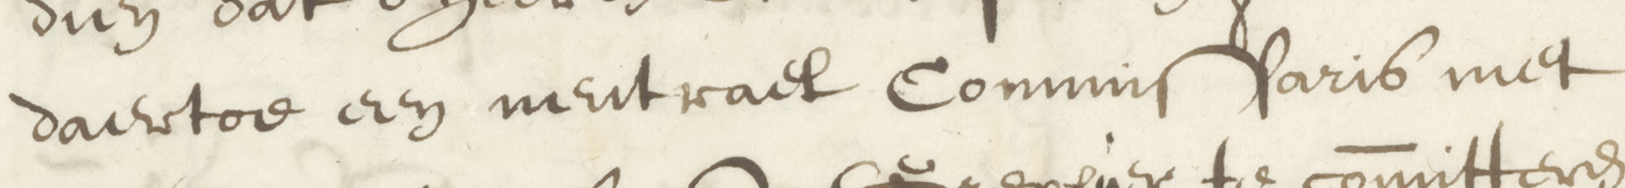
daertoe een neutrael Commissaris met
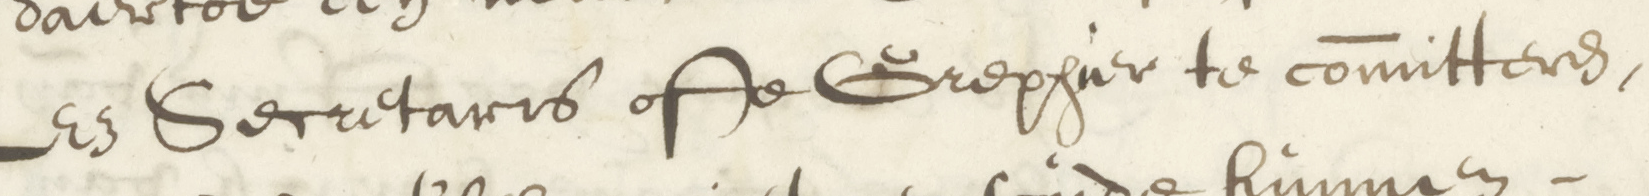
een Secretaris ofte Grephier te comitteren,
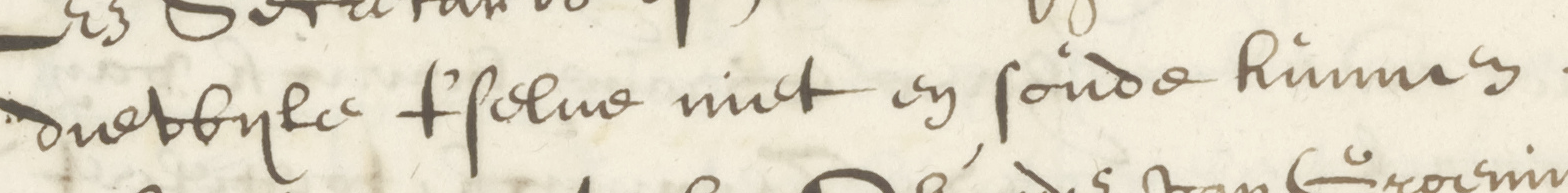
diewyle t'selue niet en soude kunnen
